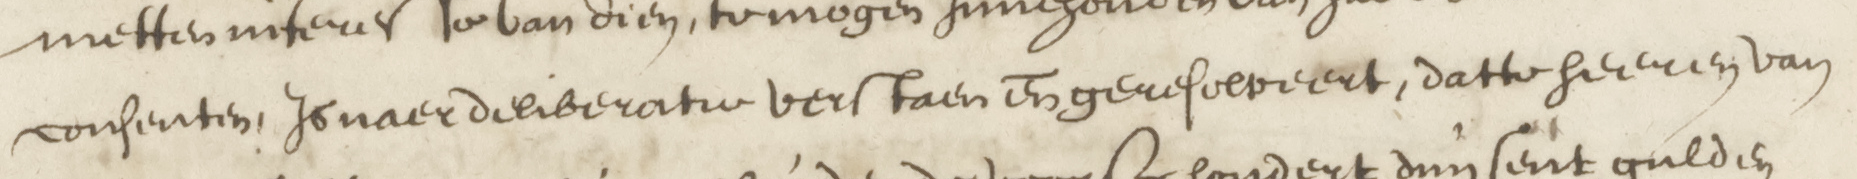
consenten. Is naer deliberatie verstaen en geresolveert, datte heeren van
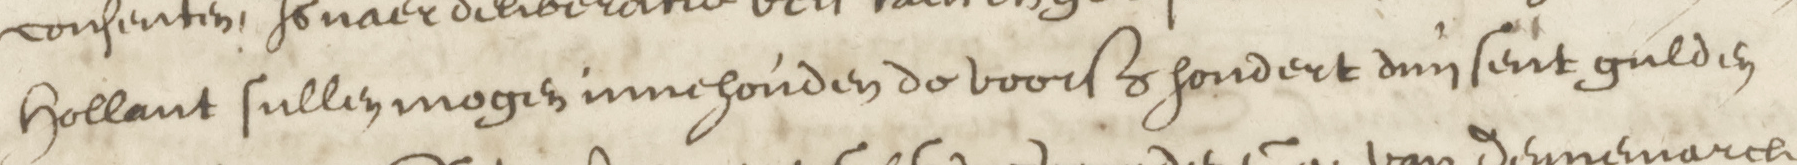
Hollant sullen mogen innehouden de voors hondert duysent gulden
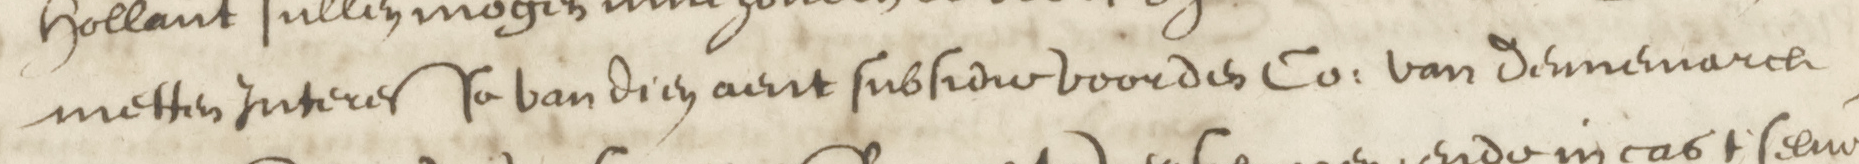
metten Interesse van dien aent subsidie voorden Co: van Dennemarck
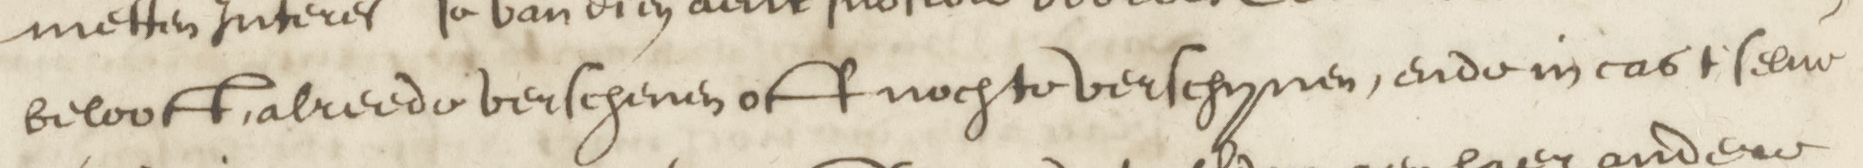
belooft, alreede verschenen off nochte verschynen, ende in cas t'selue
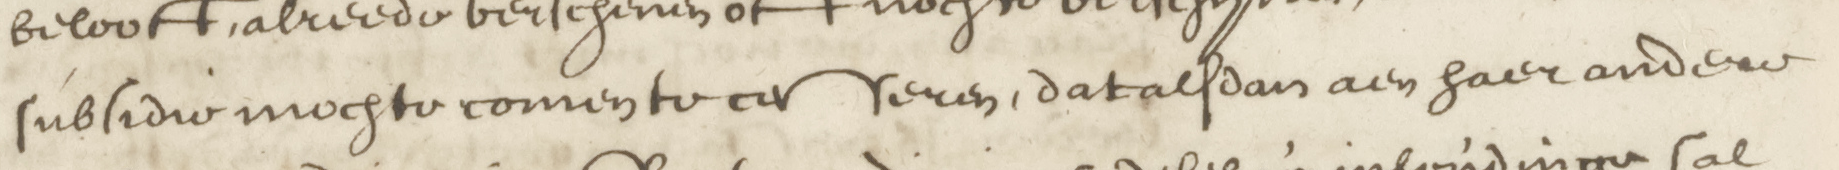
subsidie mochte comen te casseren, dat alsdan aen haer andere
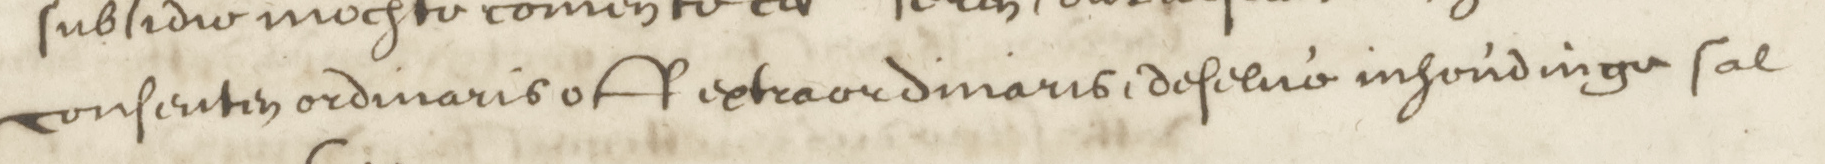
consenten ordinaris off extraordinaris, deselue inhoudinge sal
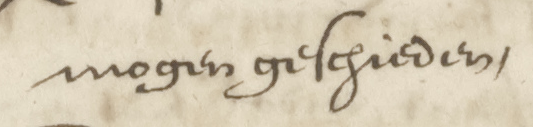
mogen geschieden.
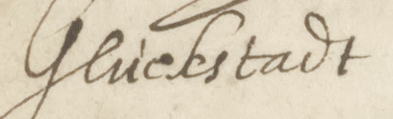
Gluckstadt
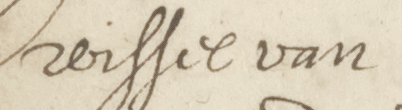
wissel van
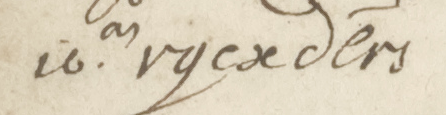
10m. rycxdlrs
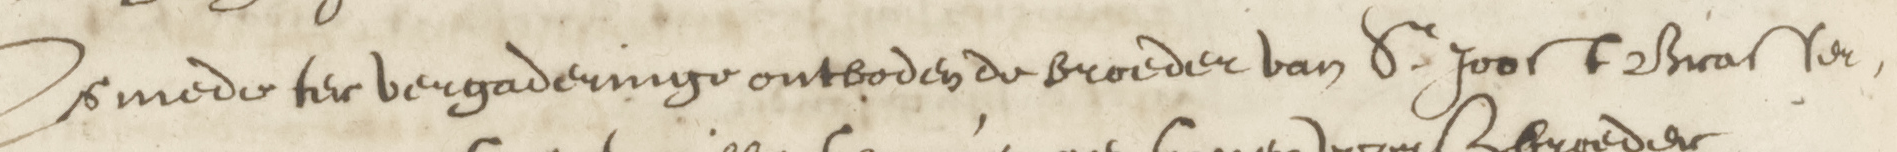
Is mede ter vergaderinge ontboden de broeder van Sr. Joost Brasser,
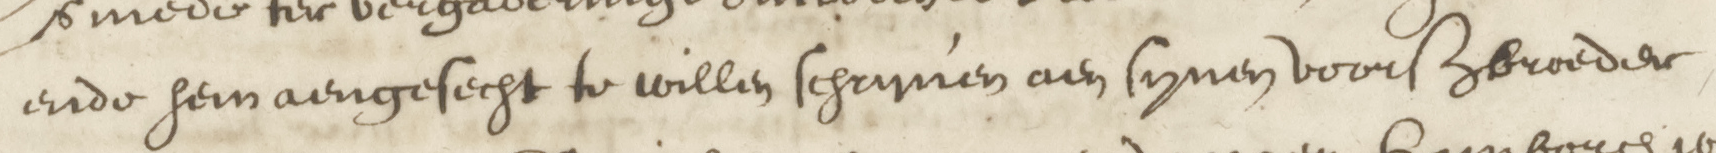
ende hem aengesecht te willen schryuen aen synen voors broeder
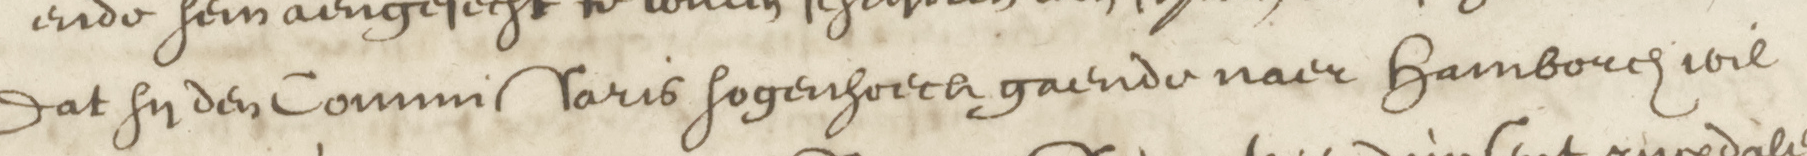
Dat hy den Commissaris hogenhoeck gaende naer Hamborch wil
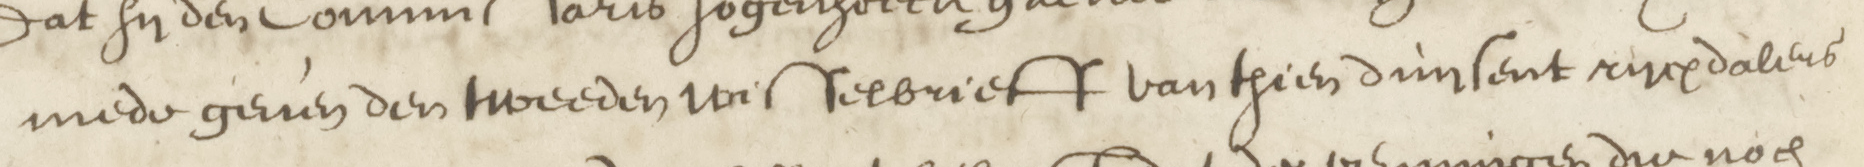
mede geuen den tweeden wisselbrieff van thien duysent rycxdalers
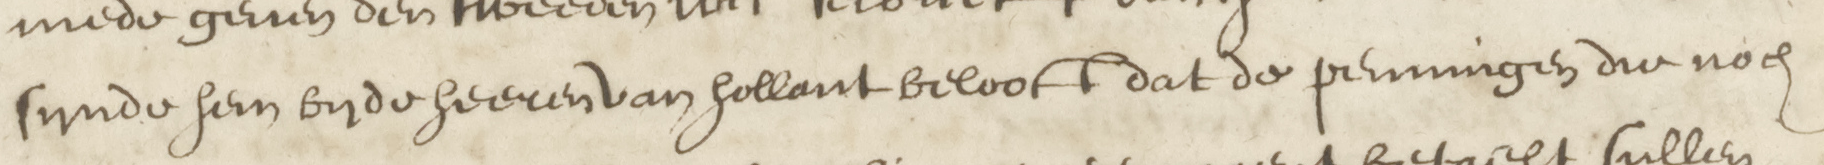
synde hem byde heeren van hollant belooft dat de penningen die noch
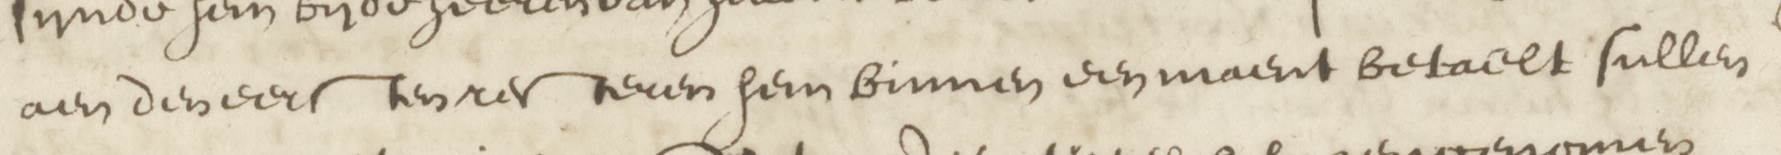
aen den eersten resteren hem binnen een maent betaelt sullen
